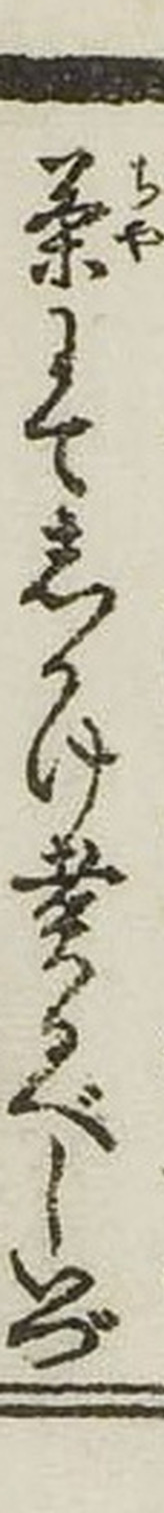茶にてしかけ煮るべしいづ
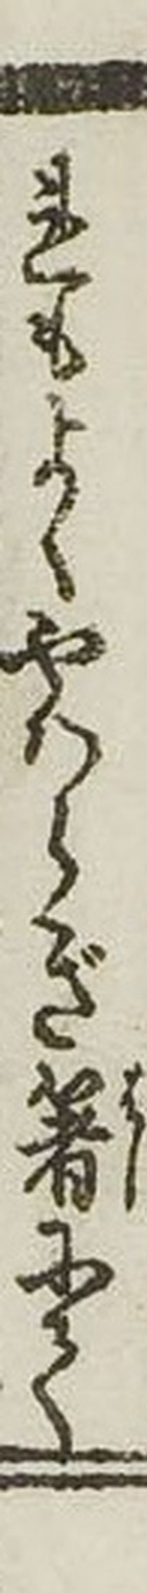れもよくやはらぎ箸にて
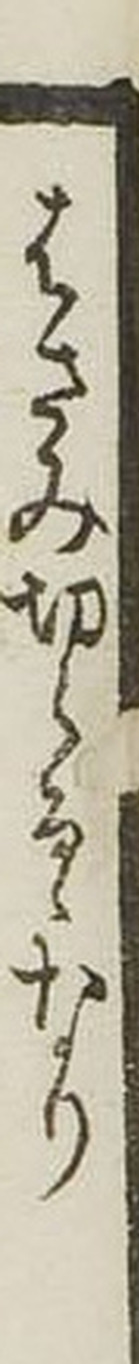はさみ切らるゝなり
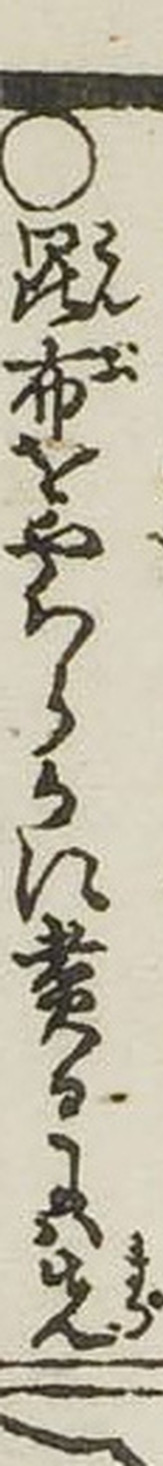〇昆布をやはらかに煮るには先
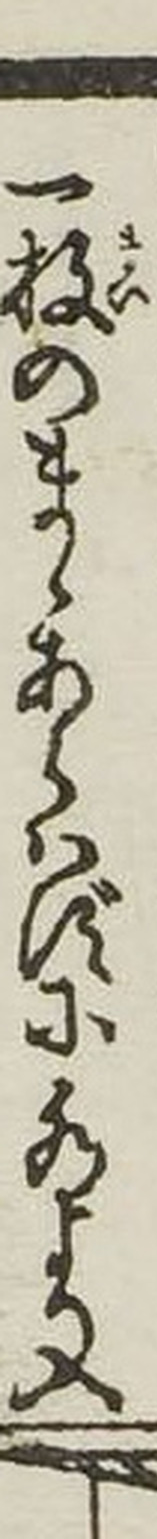一枚のまゝあらはずに水より入
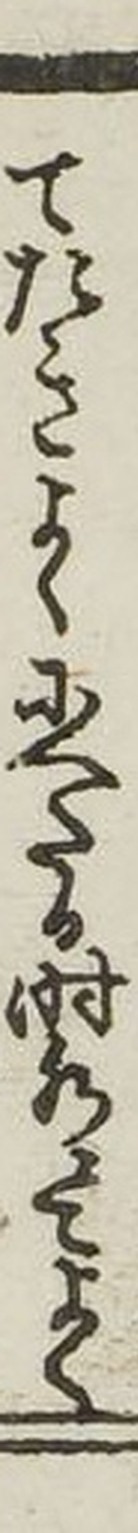てたきよくにへたる時水にてよく
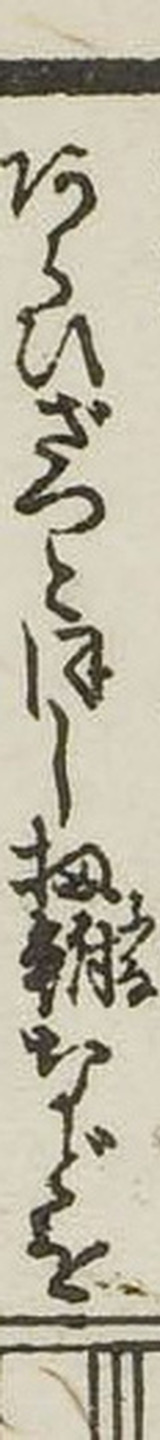あらひざつとほし扨鮒などを
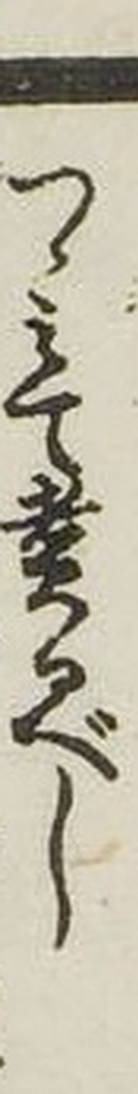つゝみて煮るべし
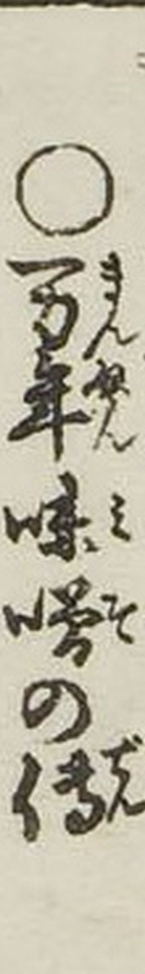〇万年味噌の伝
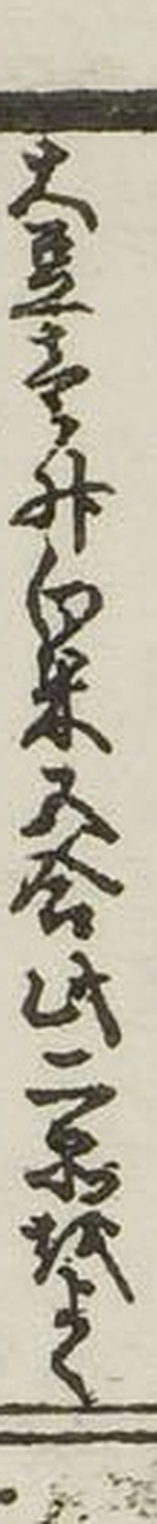大豆壱升白米五合此二品をよく
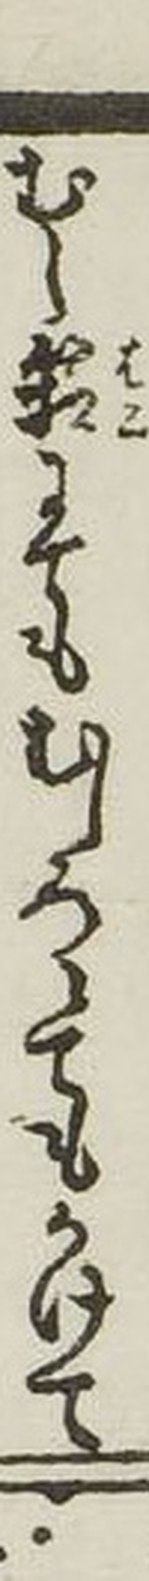むし箱にてもむしろにてもかけて
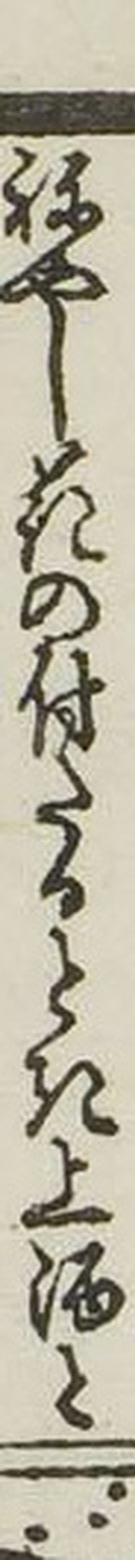ねやし花の付たるとき上酒と
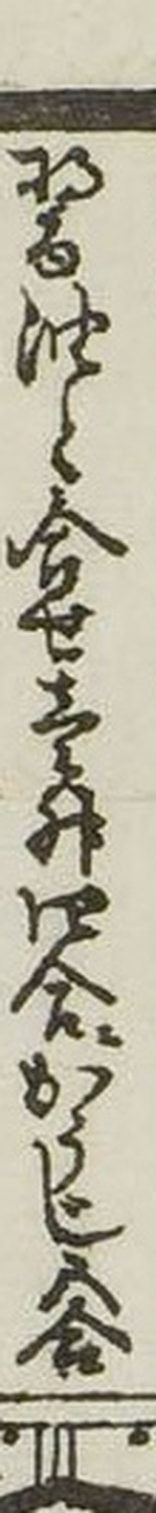醤油と合せ壱升四合にかうじ五合
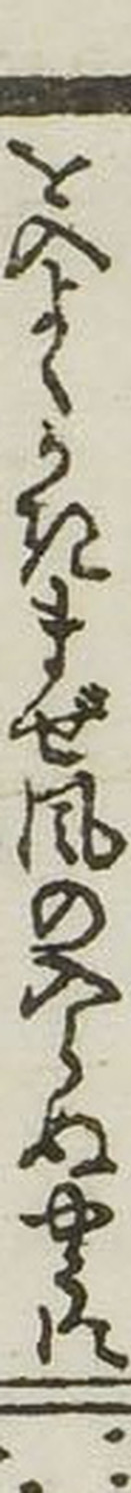を入よくかきまぜ風の入らぬやうに
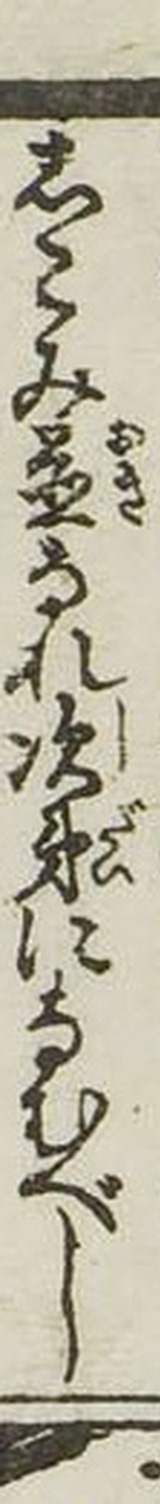しこみ置なれ次第になむべし
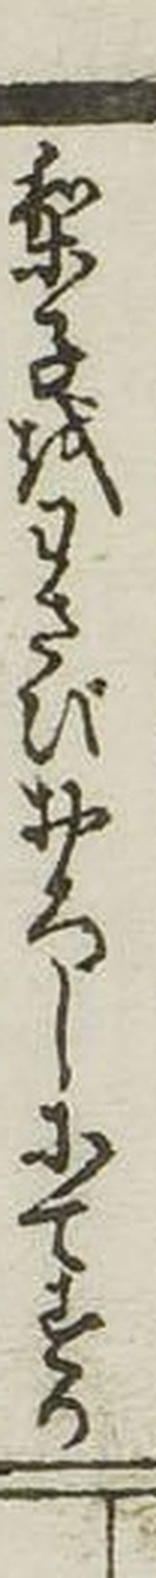梨子をわさびおろしにてすり
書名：商人書翰便覧
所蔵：東京学芸大学教育コンテンツアーカイブ
